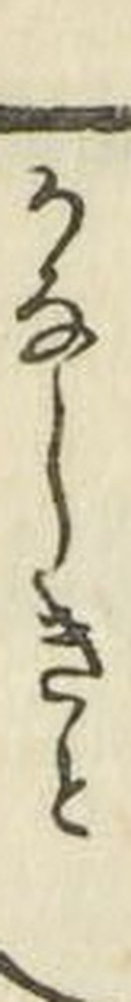かなしきと
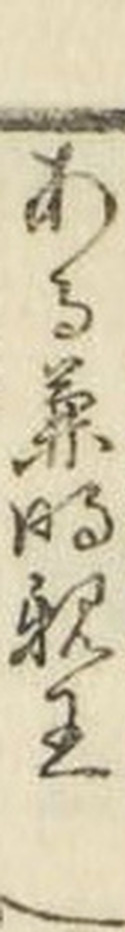ある兼明親王
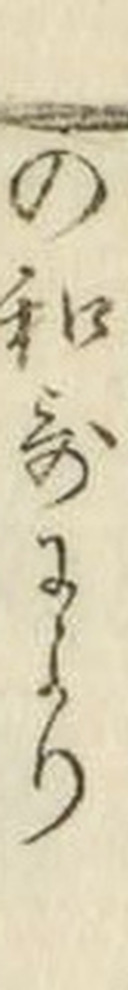の和哥により
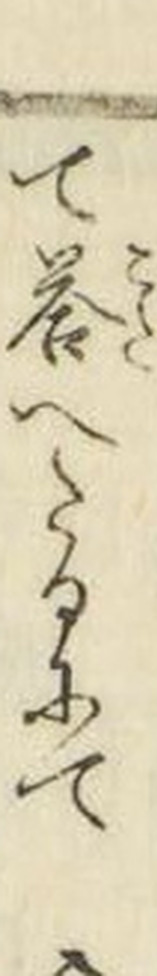て答へたるにて
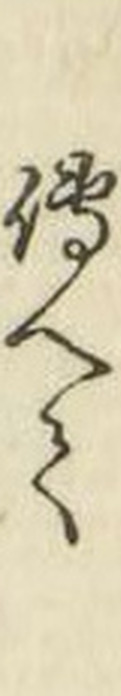傳へて
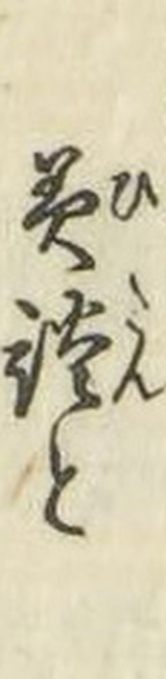美談と

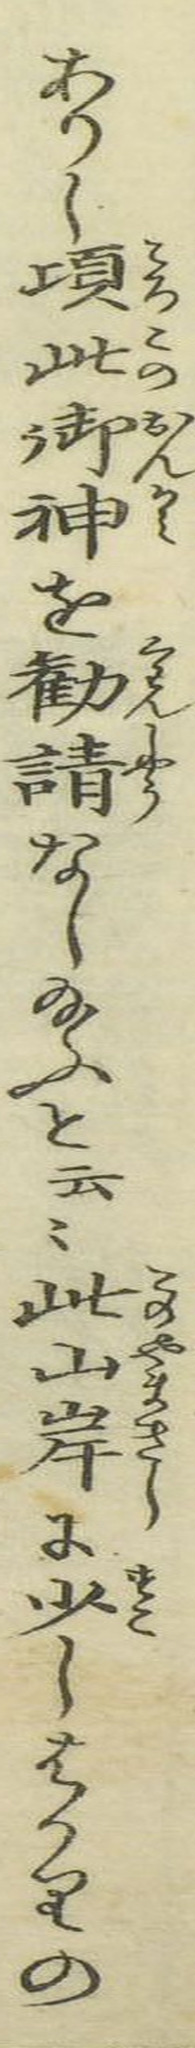ありし頃此御神を勧請なし給と云々此山岸に少しはかりの
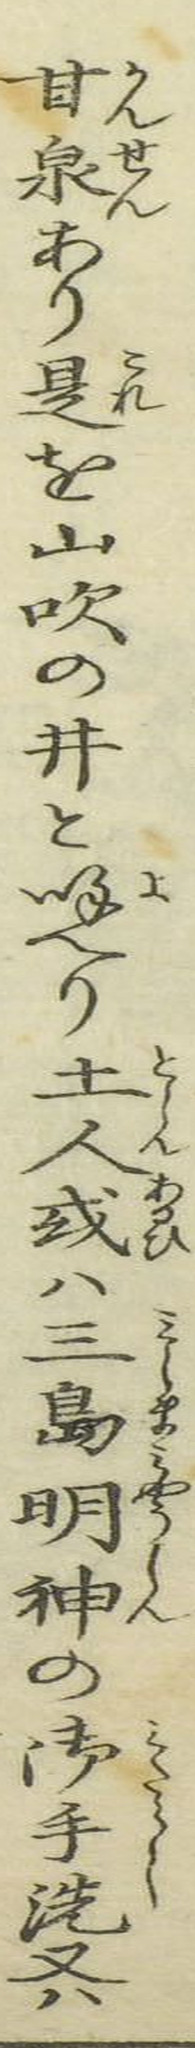甘泉あり是を山吹の井と呼へり土人或は三島明神の御手洗又は
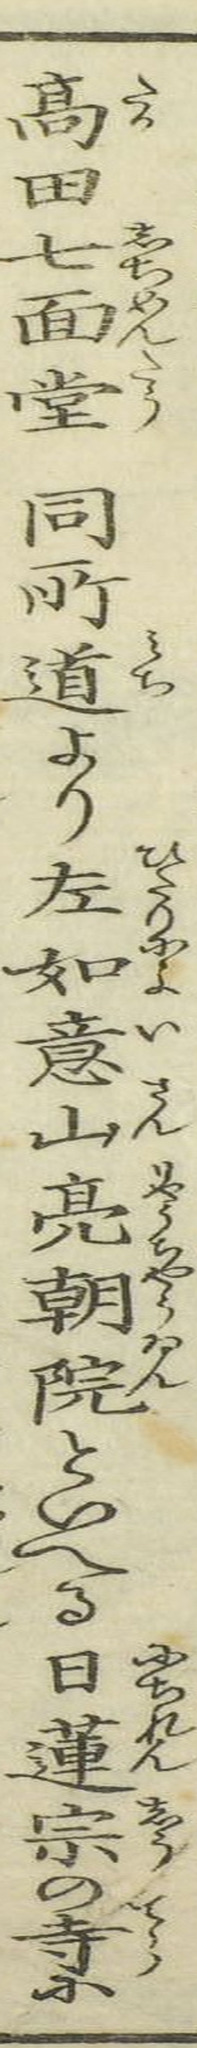髙田七面堂同所道より左如意山亮朝院といへる日蓮宗の寺に
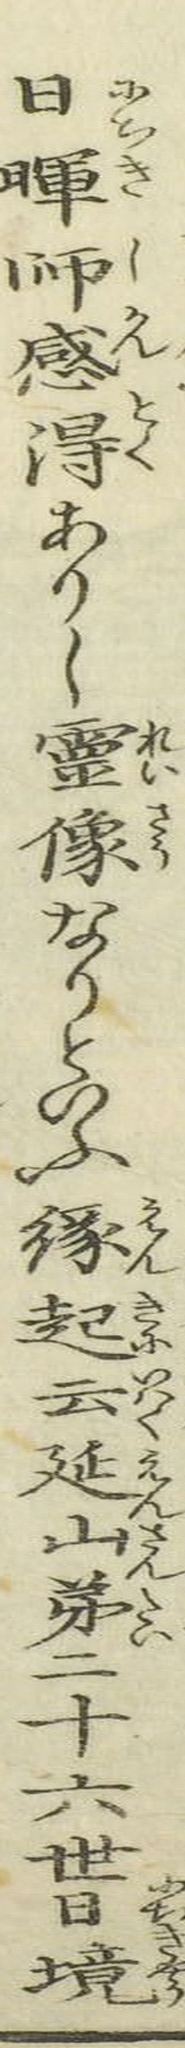日暉師感得ありし靈像なりといふ緣起云延山弟二十六世日境
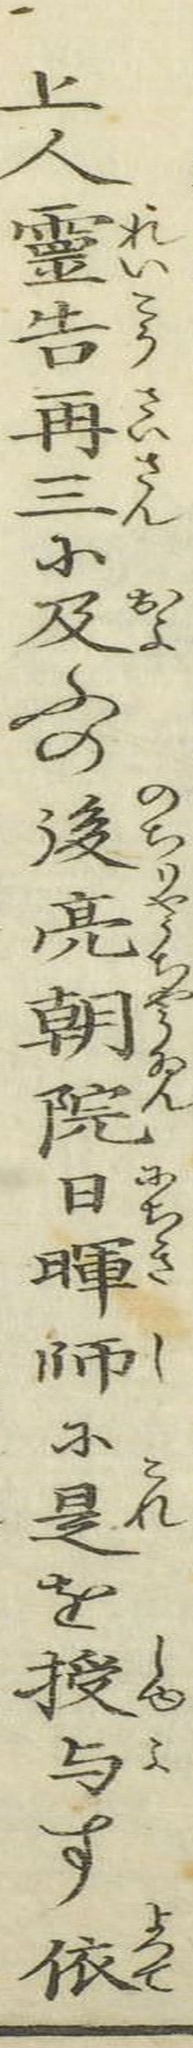上人靈告再三に及ふの後亮朝院日暉師に是を授与す依
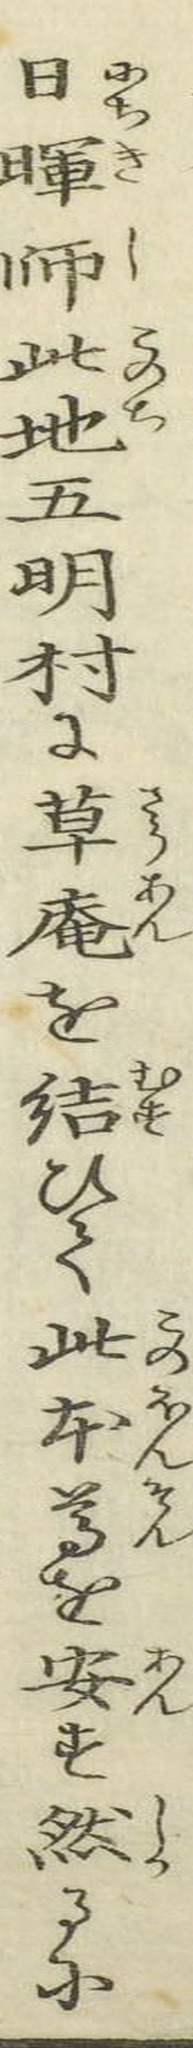日暉師此地五明村に草庵を結ひて此本尊を安す然るに
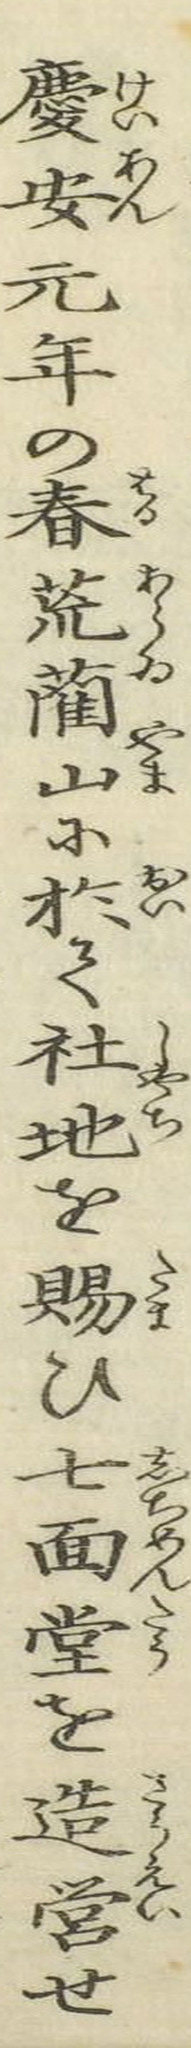慶安元年の春荒藺山に於て社地を賜ひ七面堂を造営せ
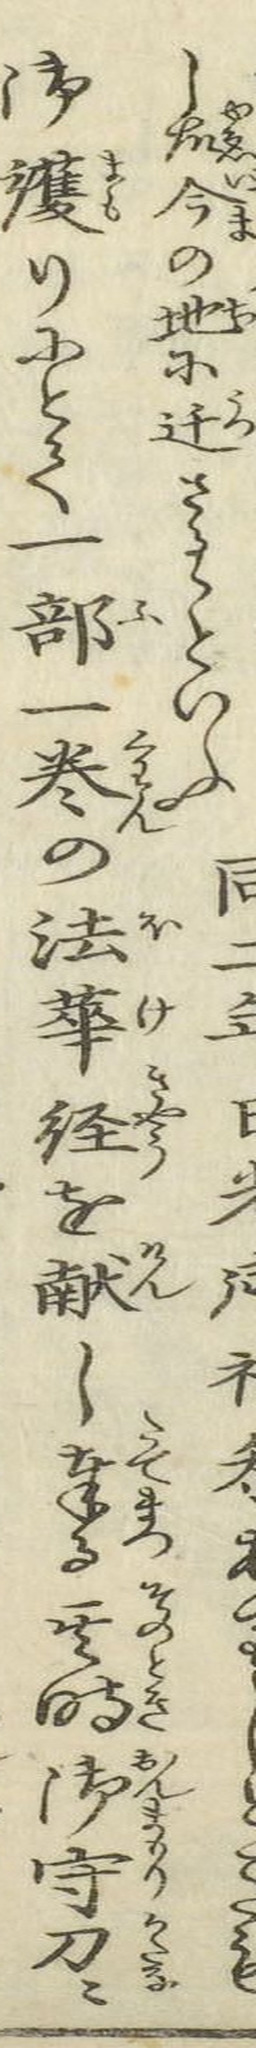御護りにとて一部一巻の法華経を献し奉る其時御守刀に
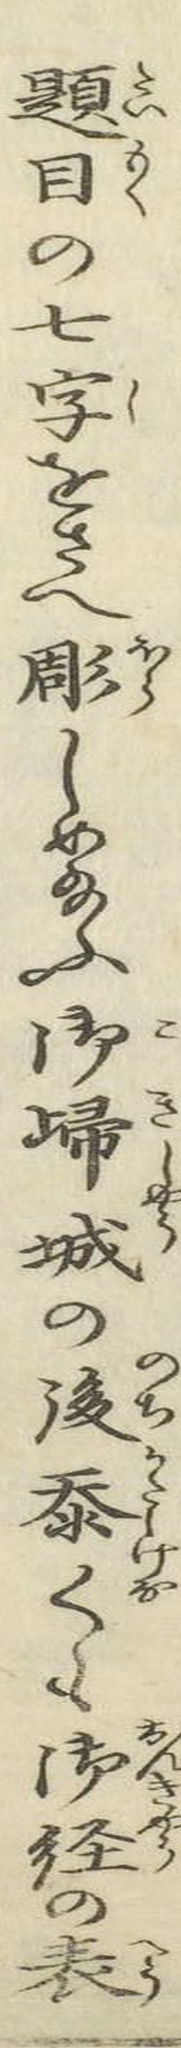題目の七字をさへ彫しめ給ふ御㱕城の後忝くも御経の表

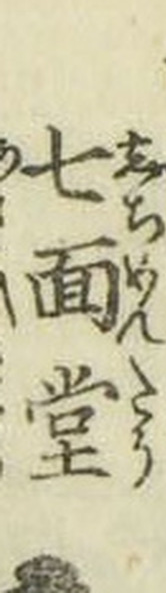七面堂
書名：江戸名所図会 20巻 巻之12
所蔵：東京学芸大学教育コンテンツアーカイブ
